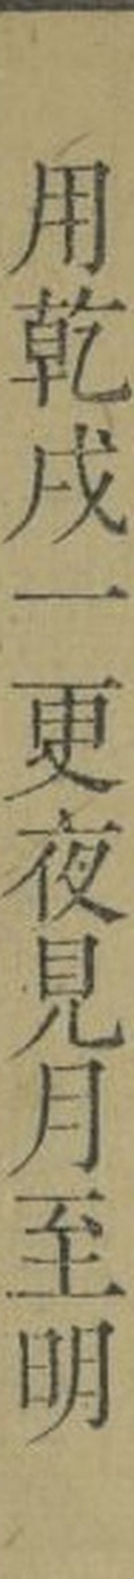用乾戌一更夜見月至明
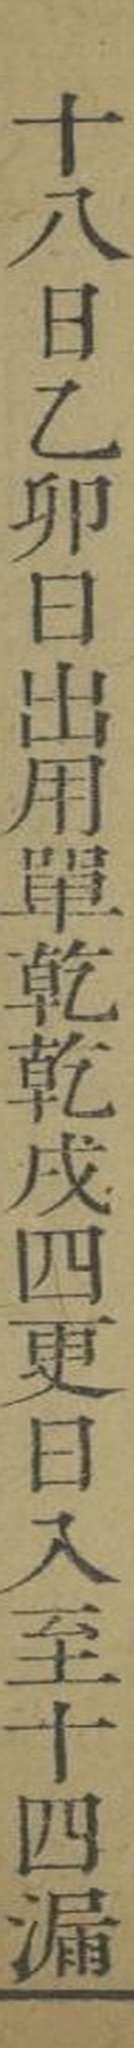十八日乙卯日出用單乾乾戌四更日入至十四漏
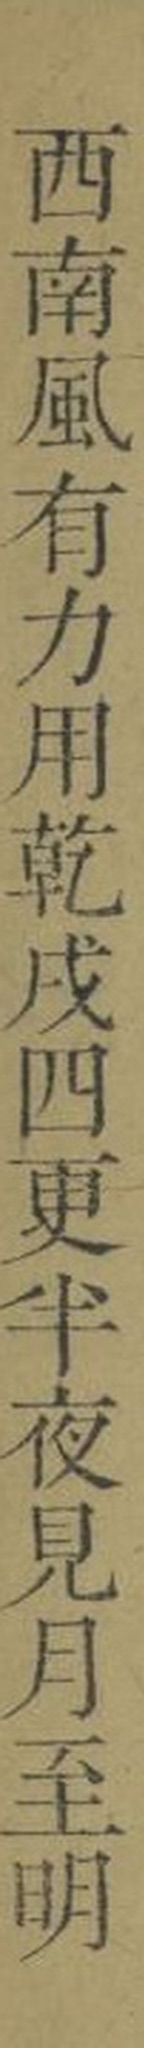西南風有力用乾戌四更半夜見月至明

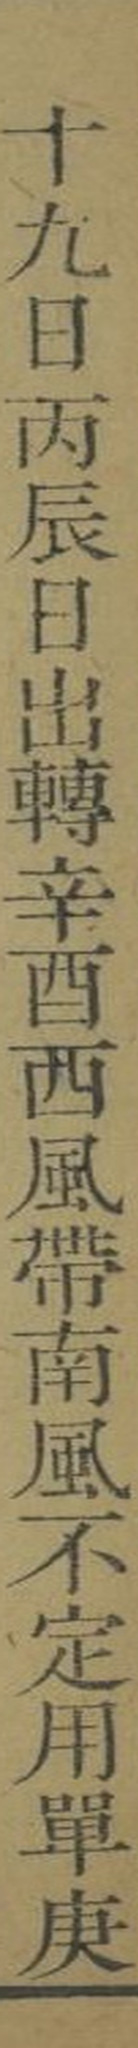十九日丙辰日出轉辛酉西風帶南風不定用單庚
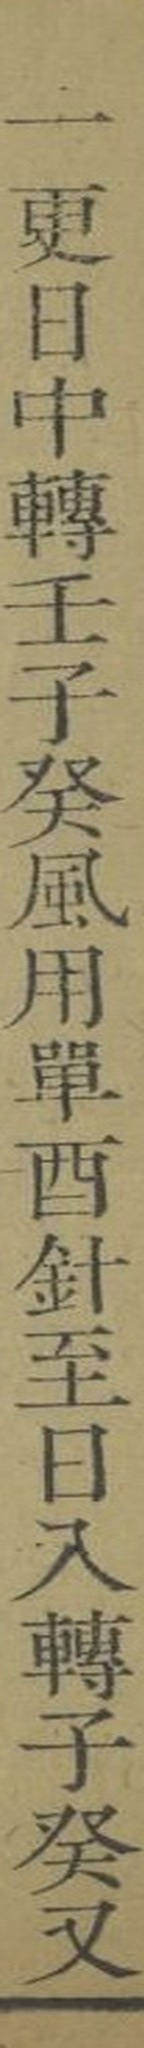一更日中轉壬子癸風用單酉針至日入轉子癸又
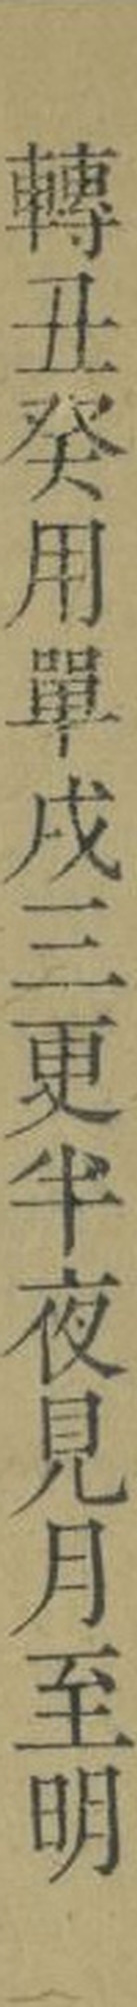轉丑癸用單戌三更半夜見月至明
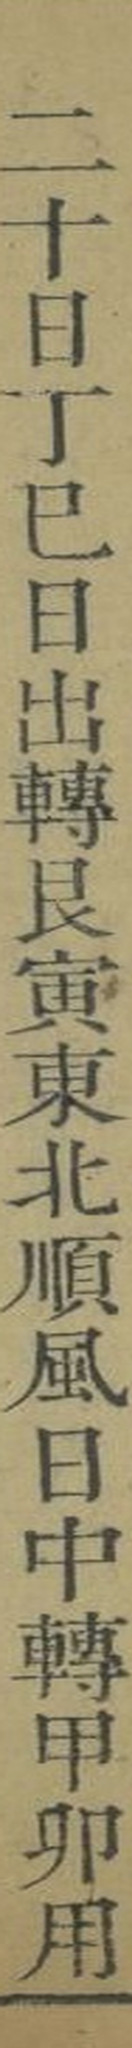二十日丁巳日出轉艮寅東北順風日中轉甲卯用
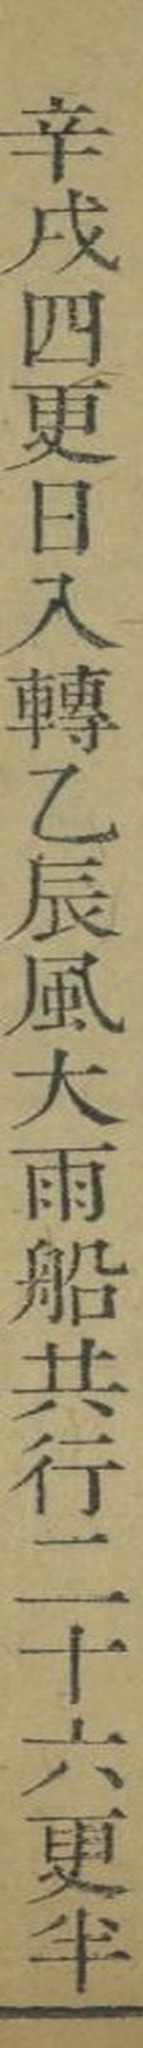辛戌四更日入轉乙辰風大雨船共行二十六更半
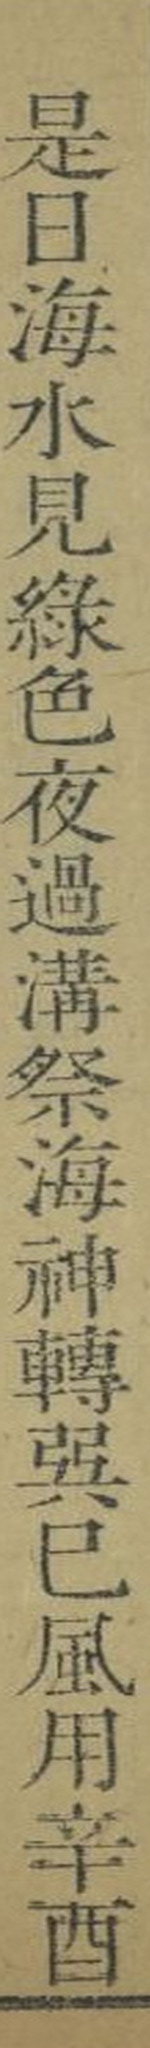是日海水見綠色夜過溝祭海神轉㢲巳風用辛酉
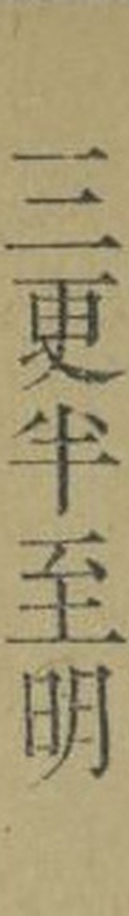三更半至明
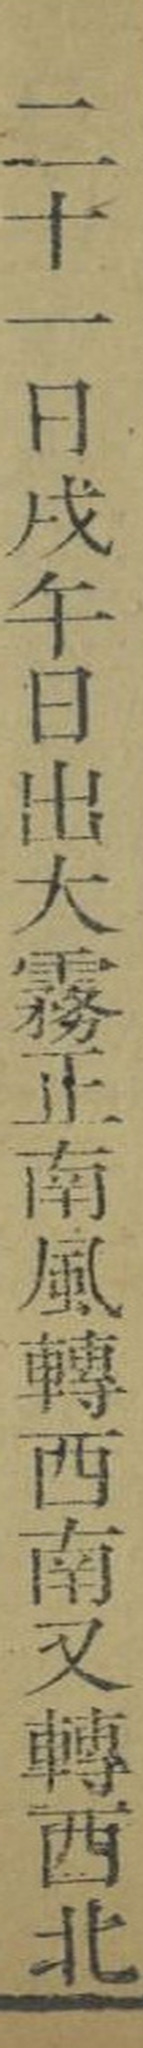二十一日戌午日出大霧正南風轉西南又轉西北
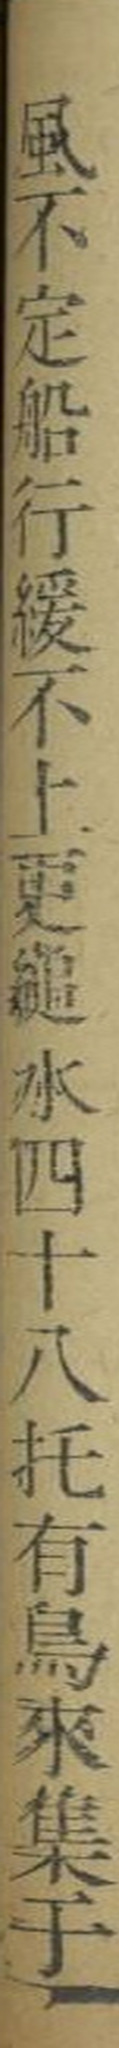風不定船行緩不上更縋水四十八托有鳥來集于
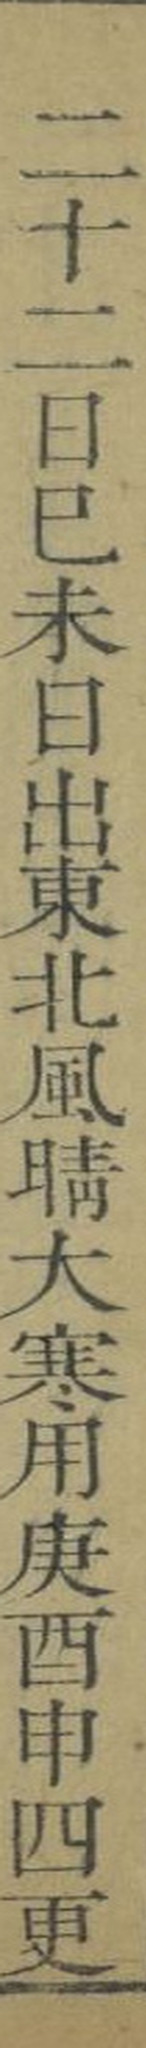二十二日巳未日出東北風晴大寒用庚酉申四更
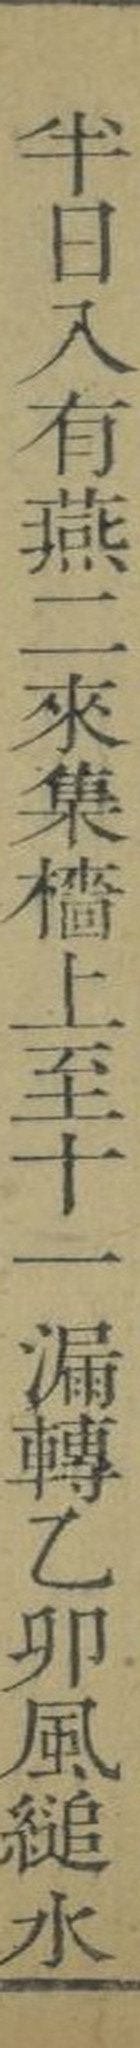半日入有燕二來集檣上至十一漏轉乙卯風縋水
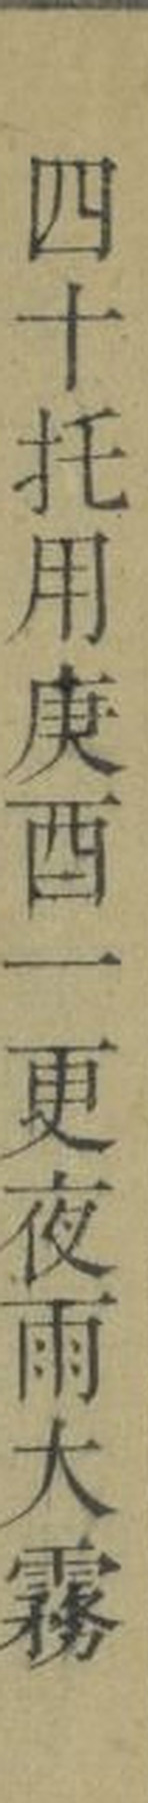四十托用庚酉一更夜雨大霧
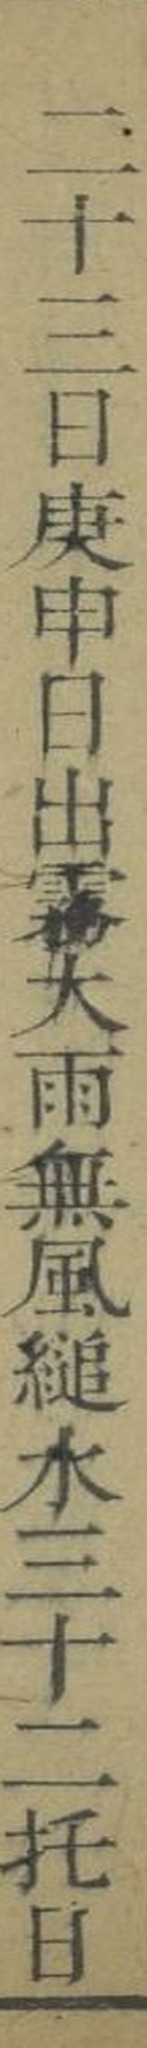二十三日庚申日出霧大雨無風縋水三十二托日
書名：中山伝信録 巻一
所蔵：University of the Ryukyus Library
